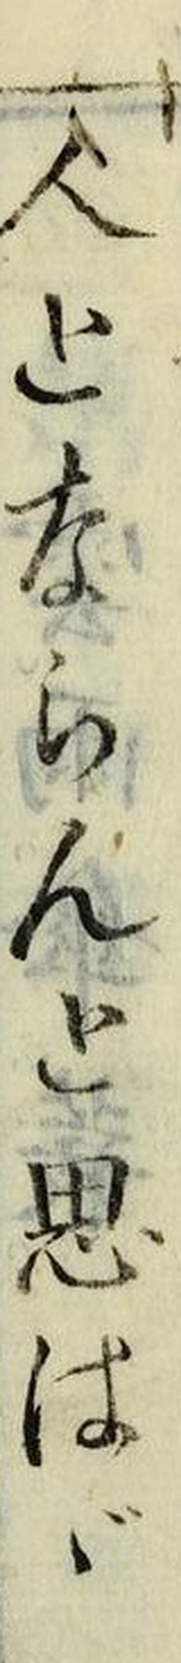人とならんと思はゞ
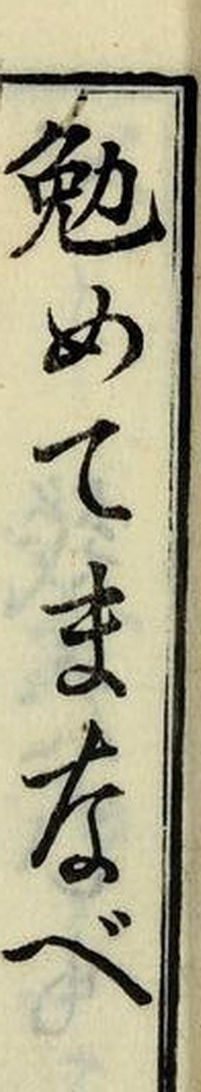勉めてまなべ
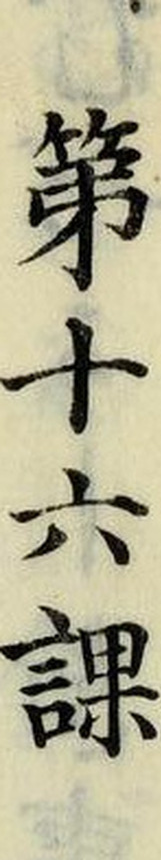第十六課
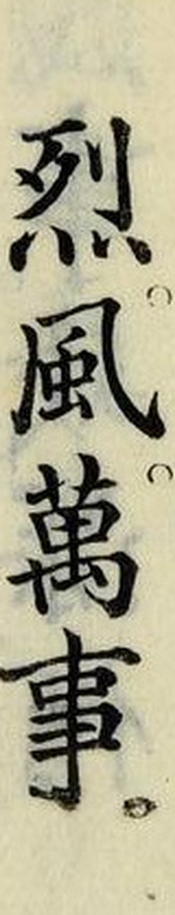烈。風。万事。
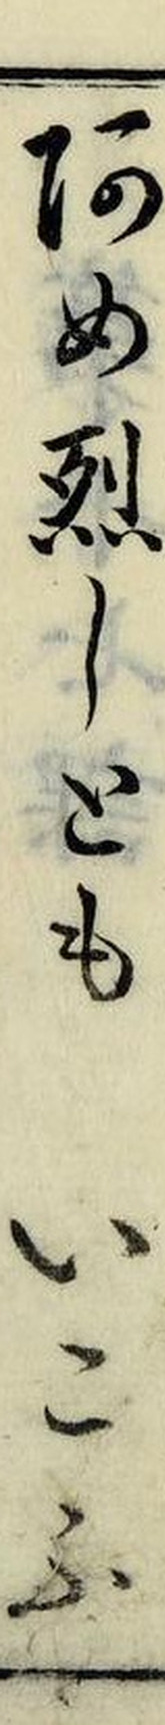あめ烈しともいこふ
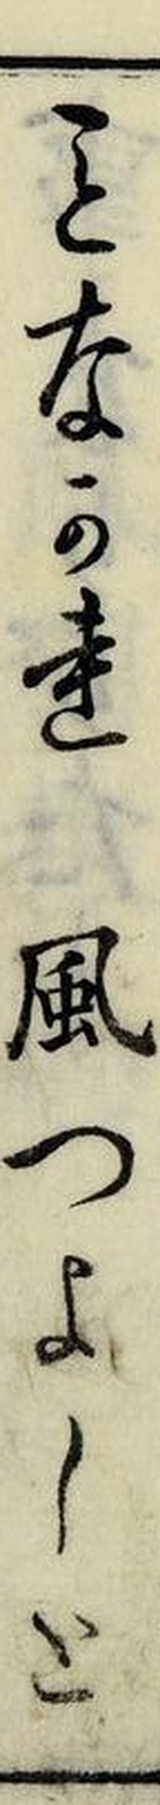ことなかれ風つよしと
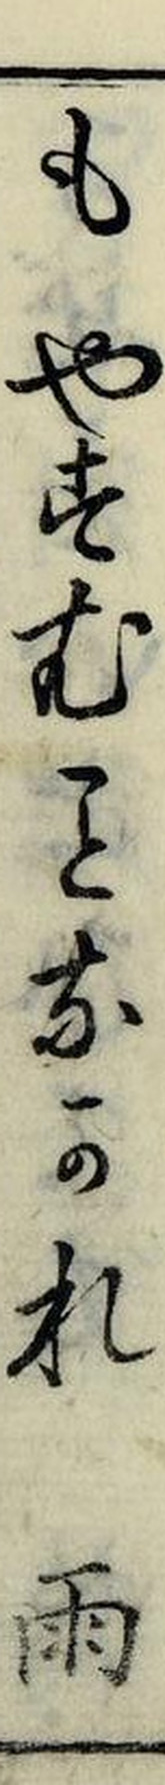もやすむことなかれ雨

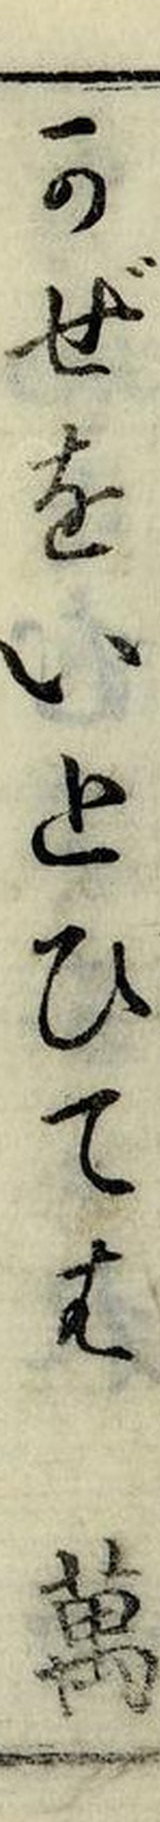かぜをいとひては万
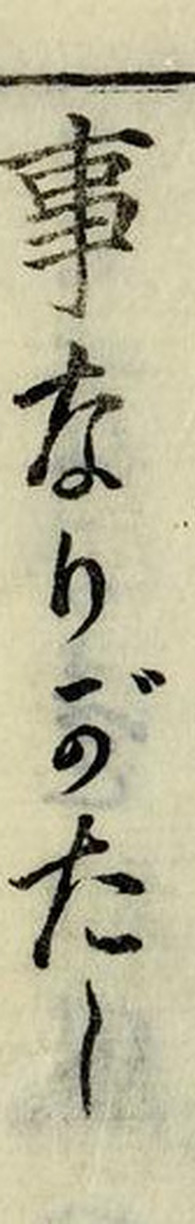事なりがたし
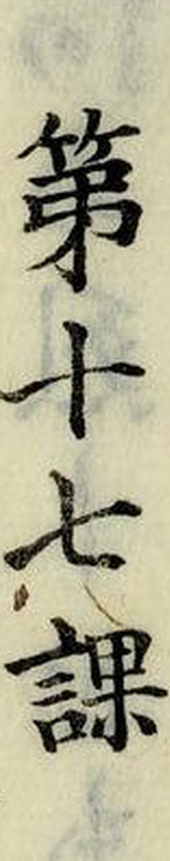第十七課
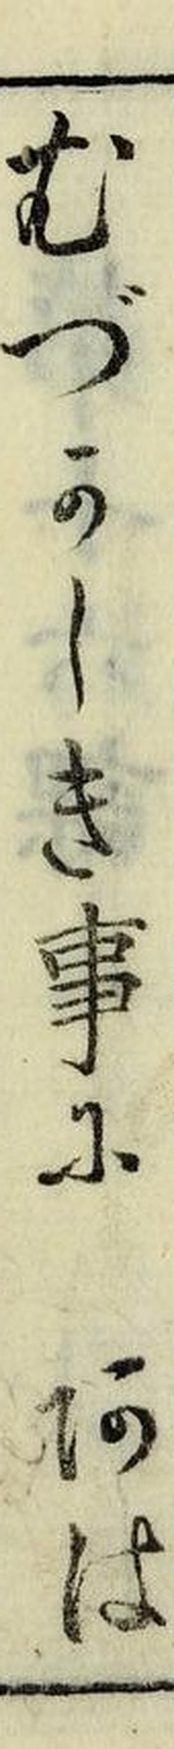むづかしき事にあは
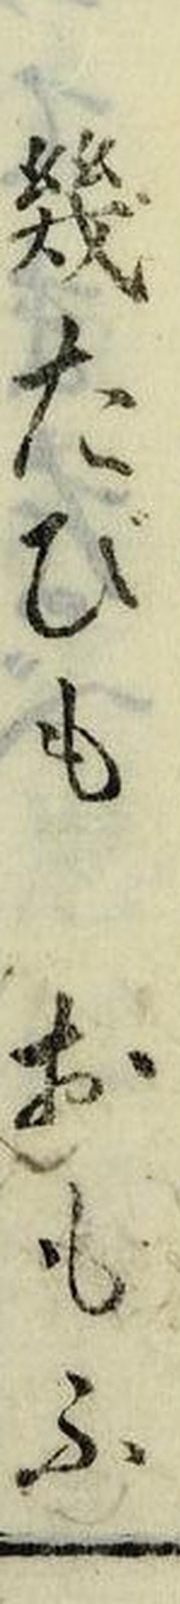ゞ幾たびもおもふ
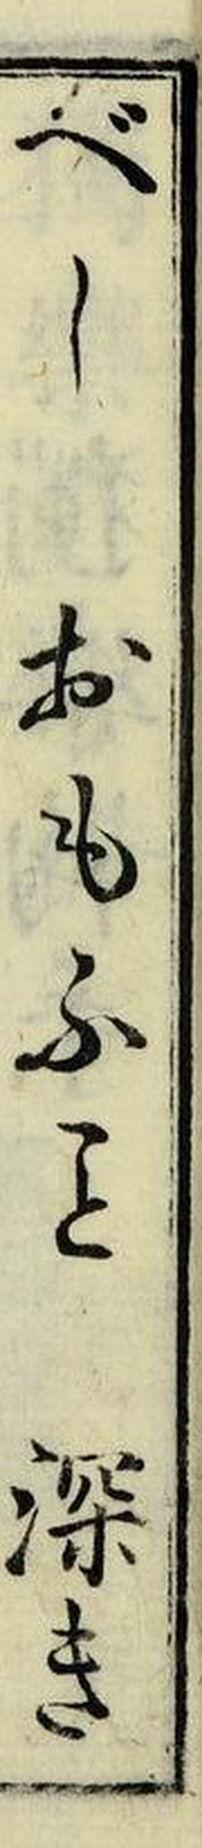べしおもふこと深き
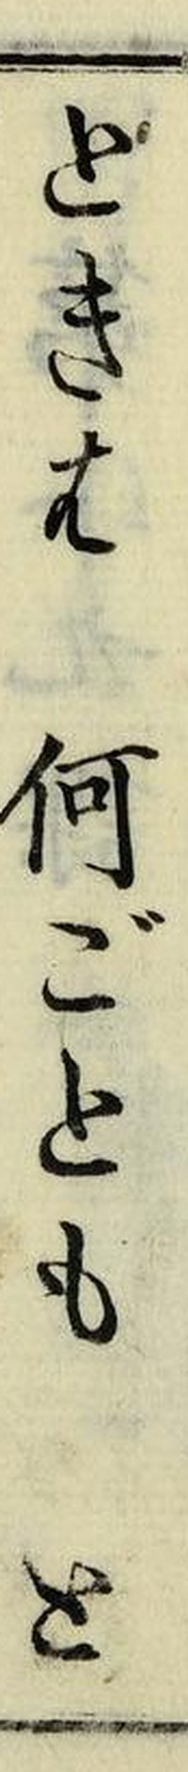ときは何ごともと
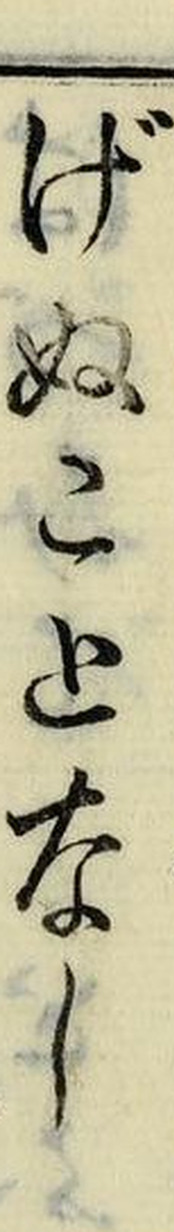げぬことなし
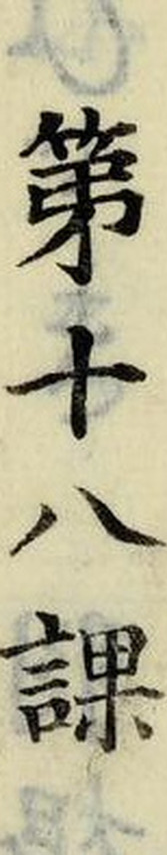第十八課
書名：小学読本 初等科 巻一
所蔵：福井県文書館 Fukui Prefectural Archives
